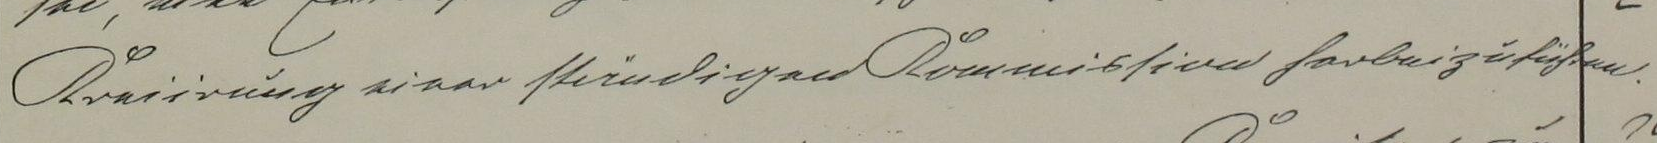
Kreiirung einer ständigen Kommission herbeizuführen.
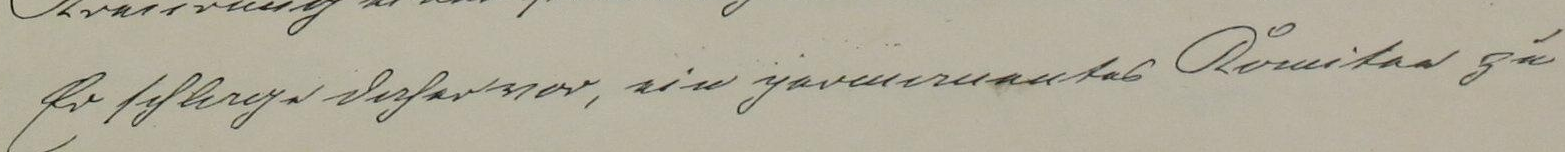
Er schlage daher vor, ein permanentes Komitee zu
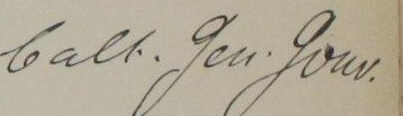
balt. Gen. Gouv.
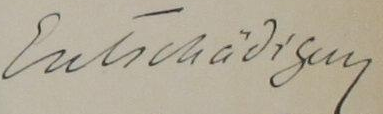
Entschädigung
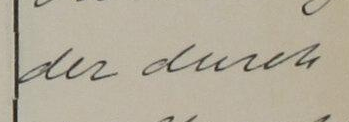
der durch
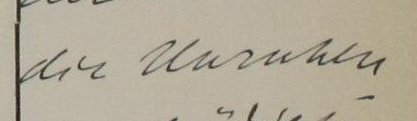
die Unruhen
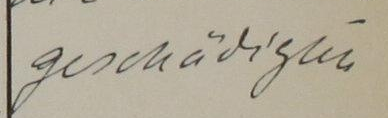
Geschädigten
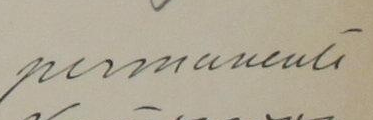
permanente
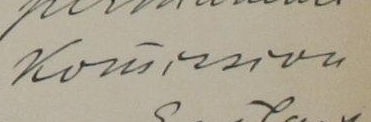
Kommission
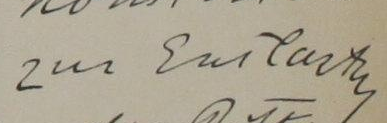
zur Entlastung
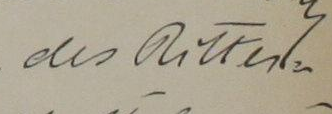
des Ritter-
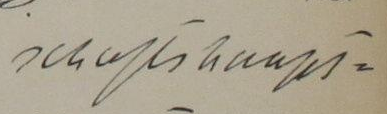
schaftshaupt-
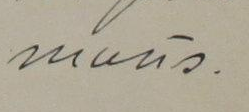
manns.
